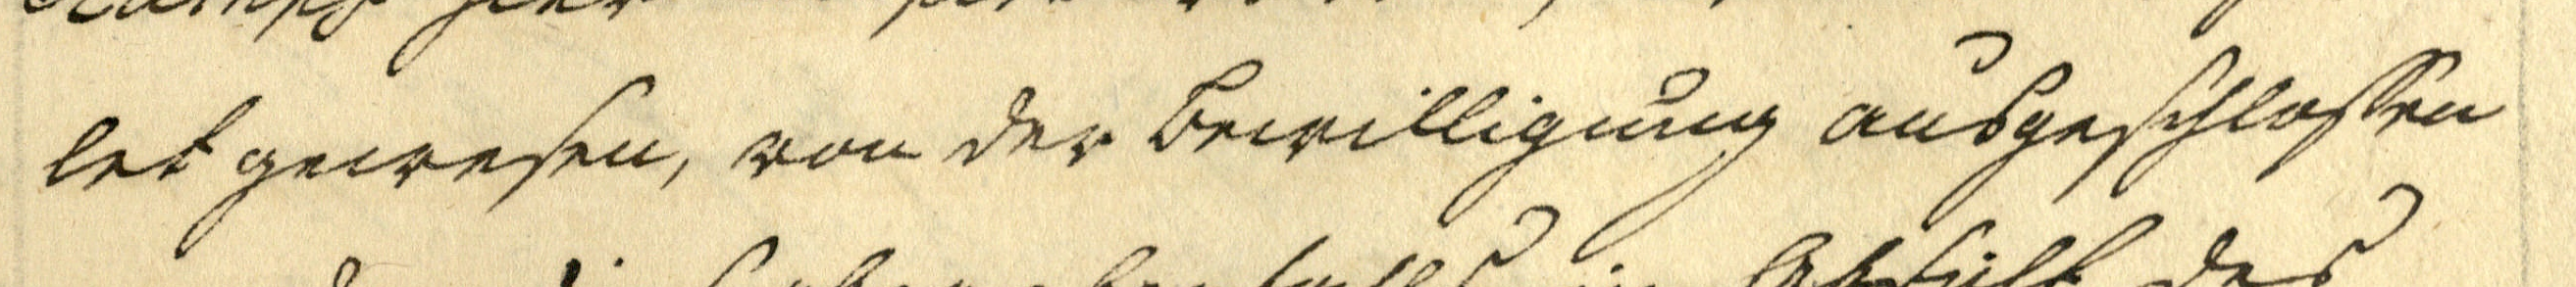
let gewesen, von der Bewilligung ausgeschlossen
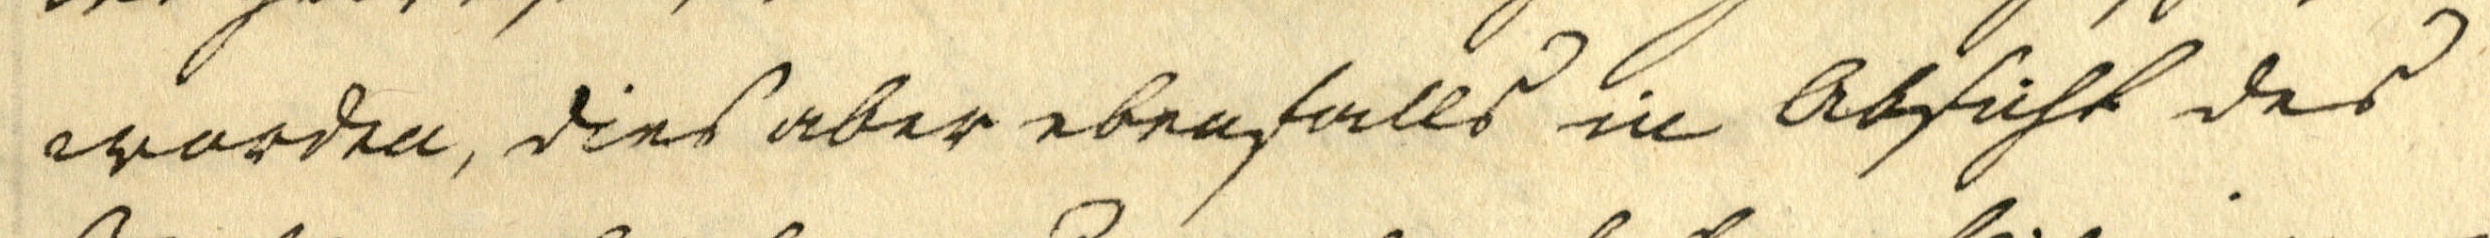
worden, dies aber ebenfalls in Absicht des
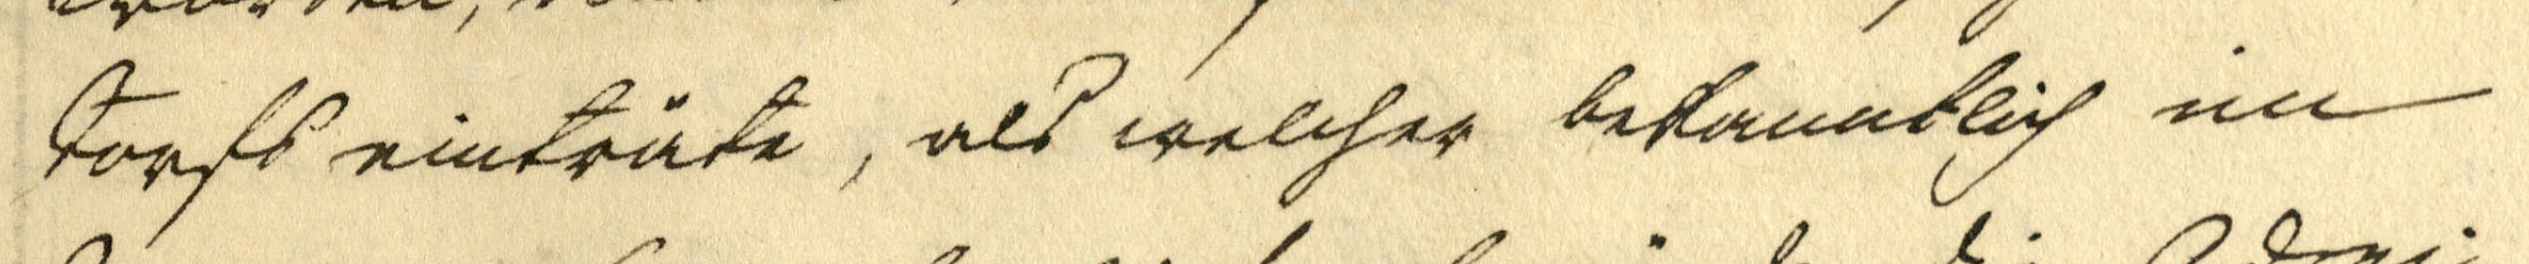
Torfs einträte, als welcher bekanntlich im
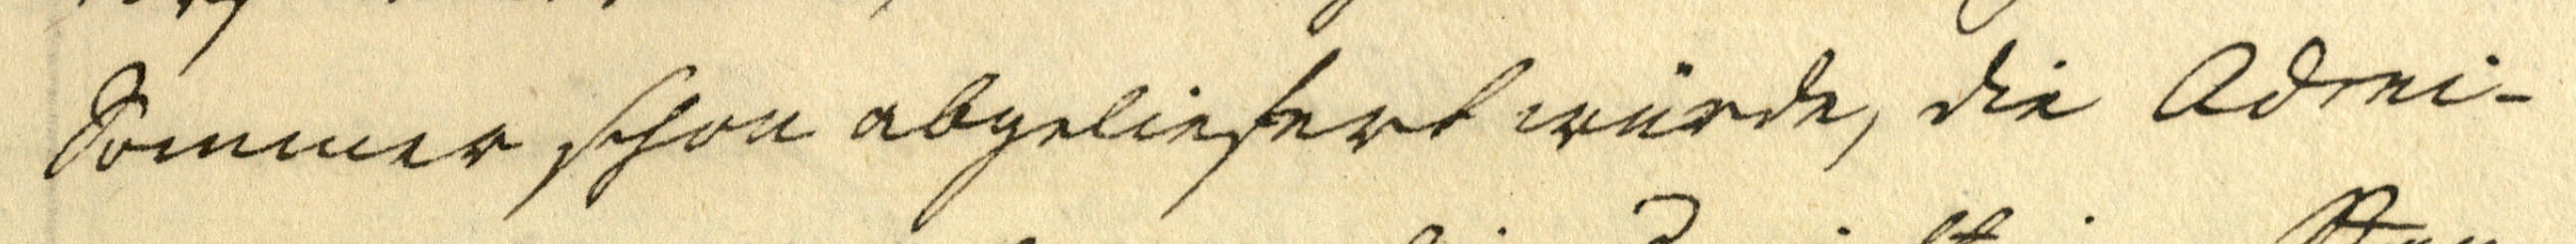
Sommer schon abgeliefert würde, die Admi¬
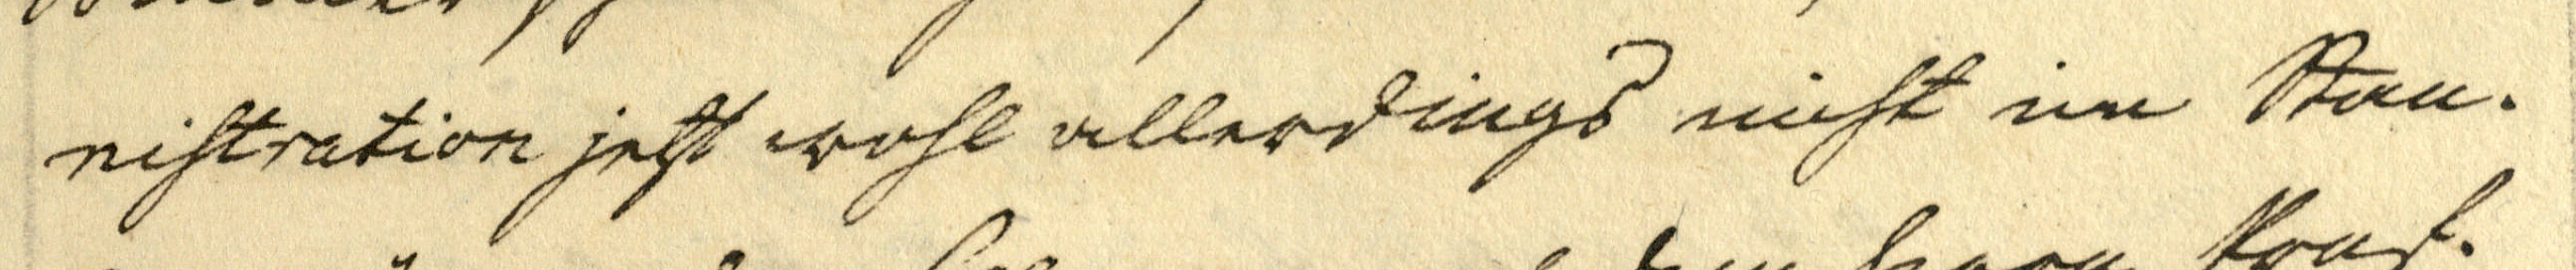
nistration jetzt wohl allerdings nicht im Stan¬
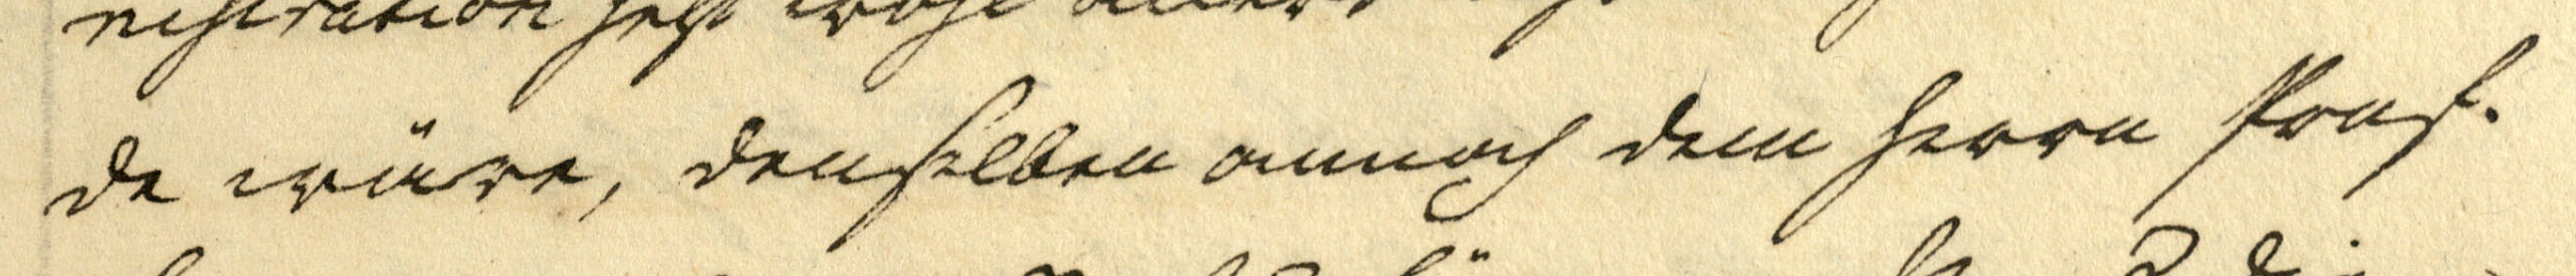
de wäre, denselben annoch dem Herrn Prof.
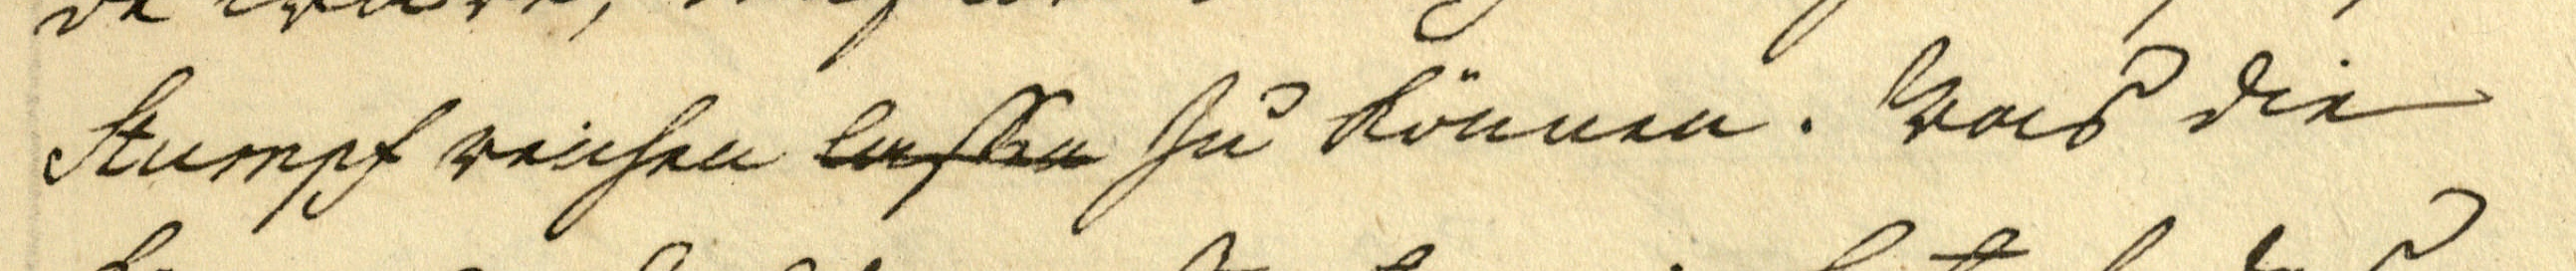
Stumpf reichen lassen zu können. Was die
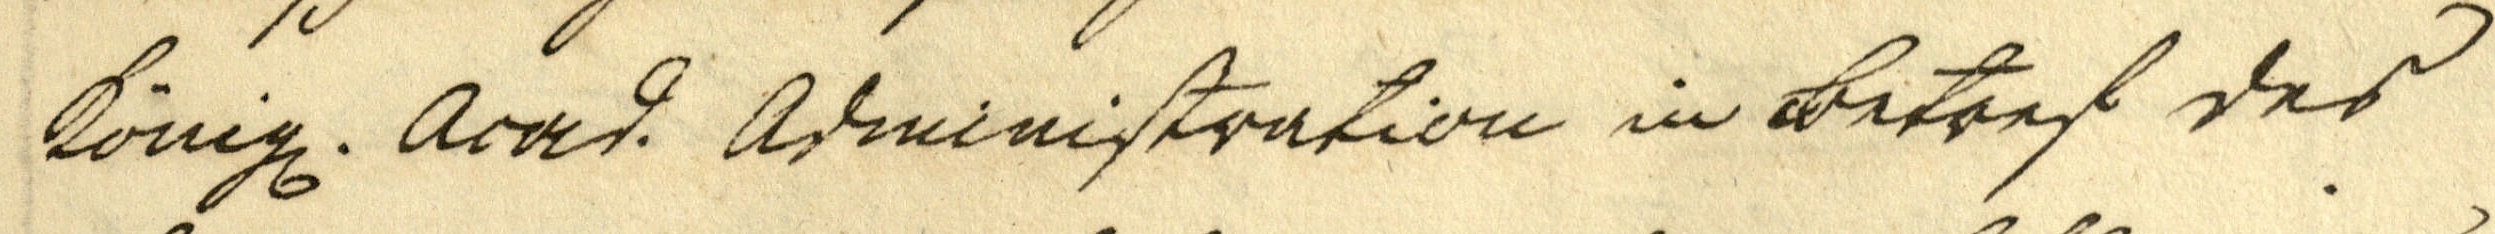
Königl. Acad. Administration in Betref des
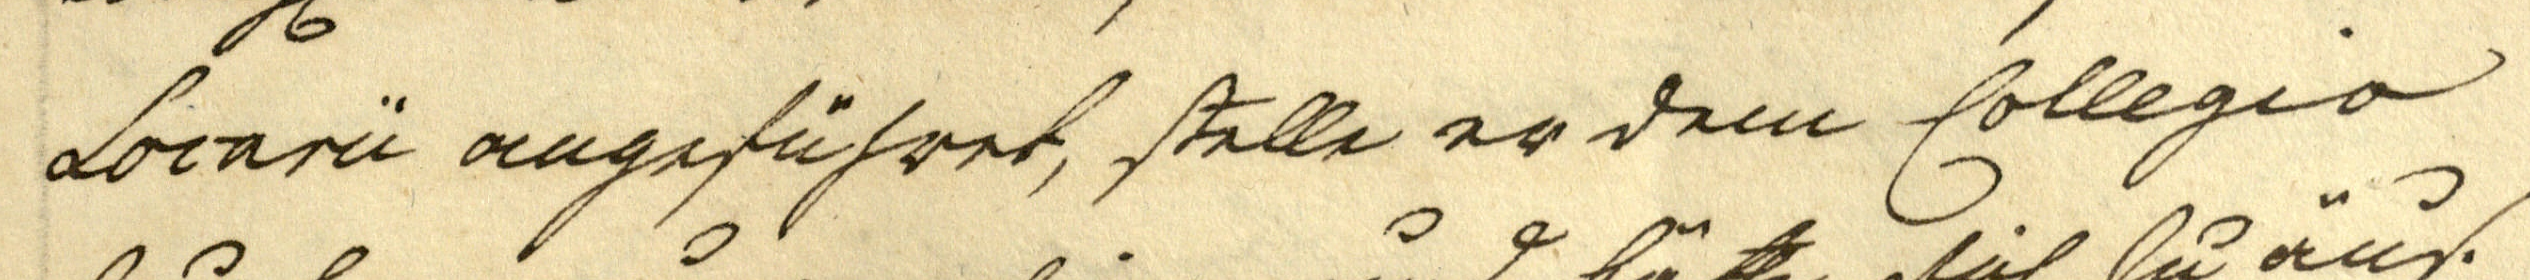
Locarii angeführet, stelle er dem Collegio
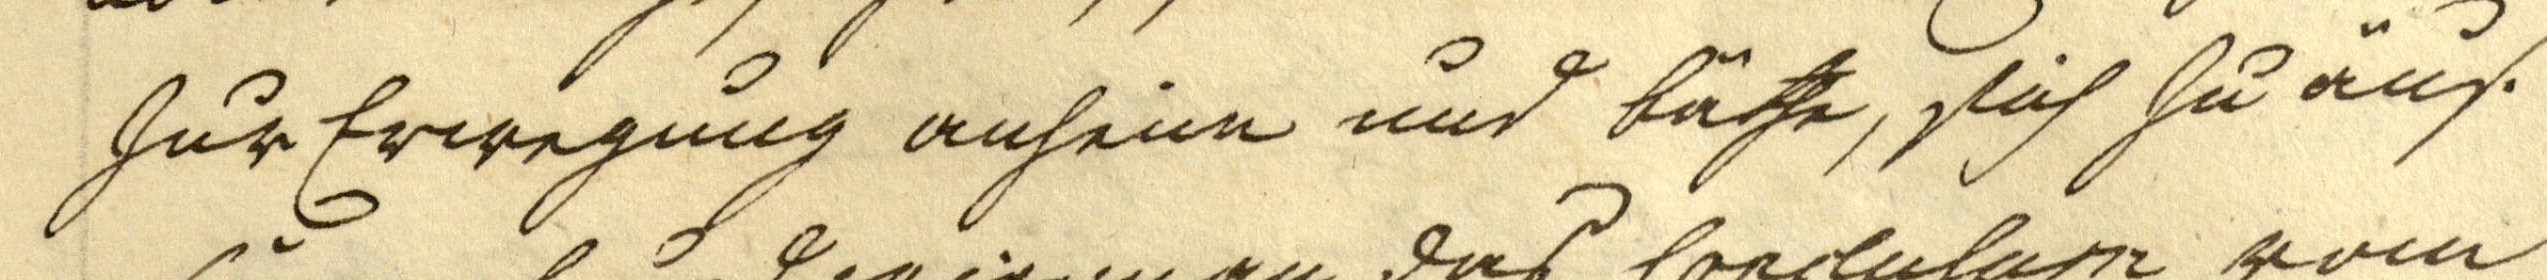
zur Erwegung anheim und bäthe, sich zu äus¬
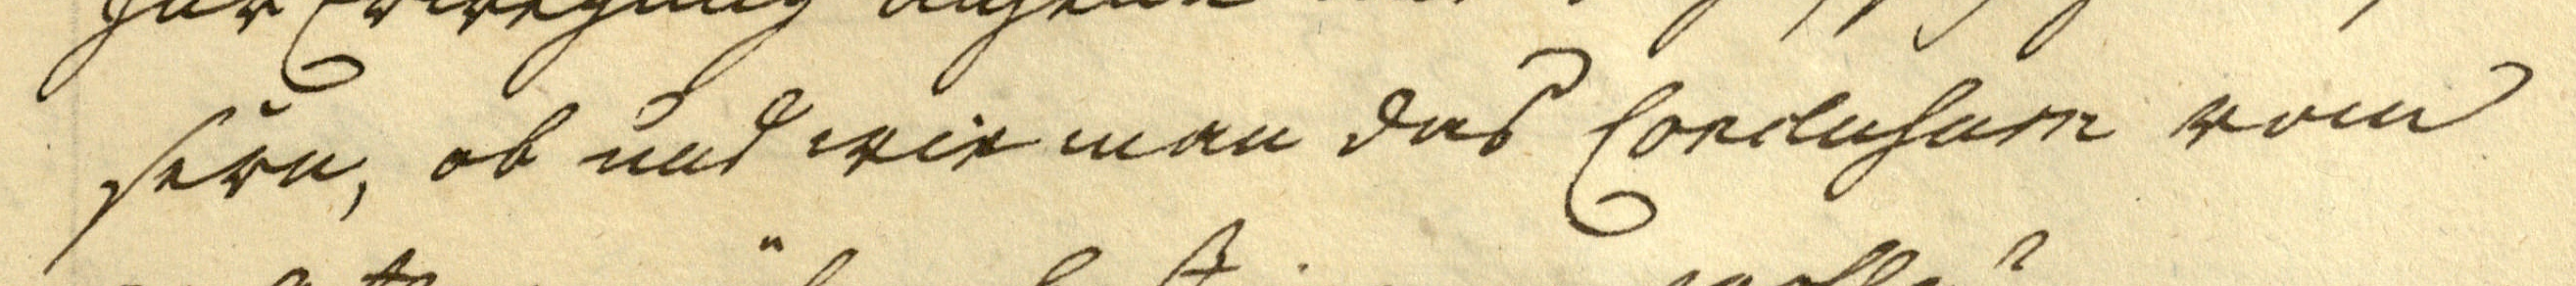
sern, ob und wie man das Conclusum vom
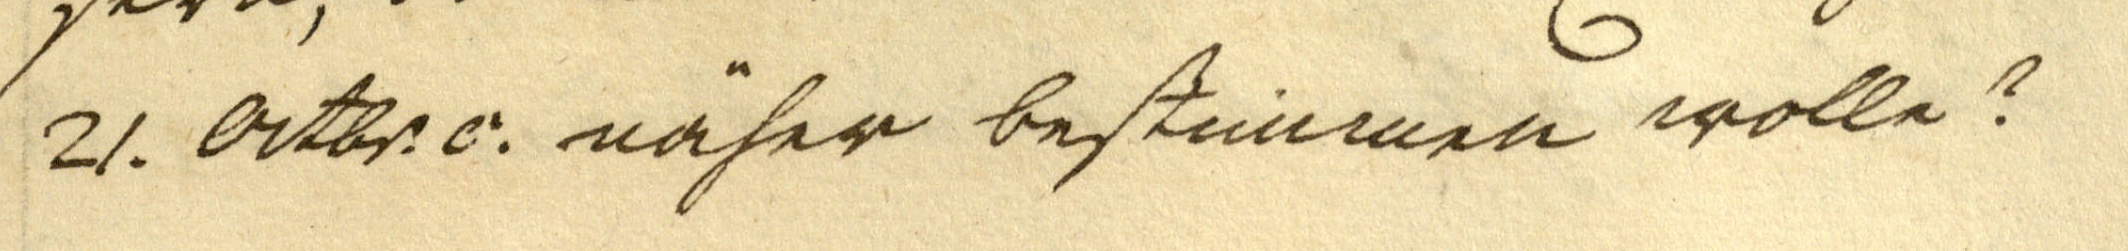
21. Octbr. c. näher bestimmen wolle?
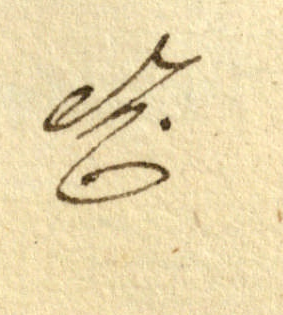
dh.
